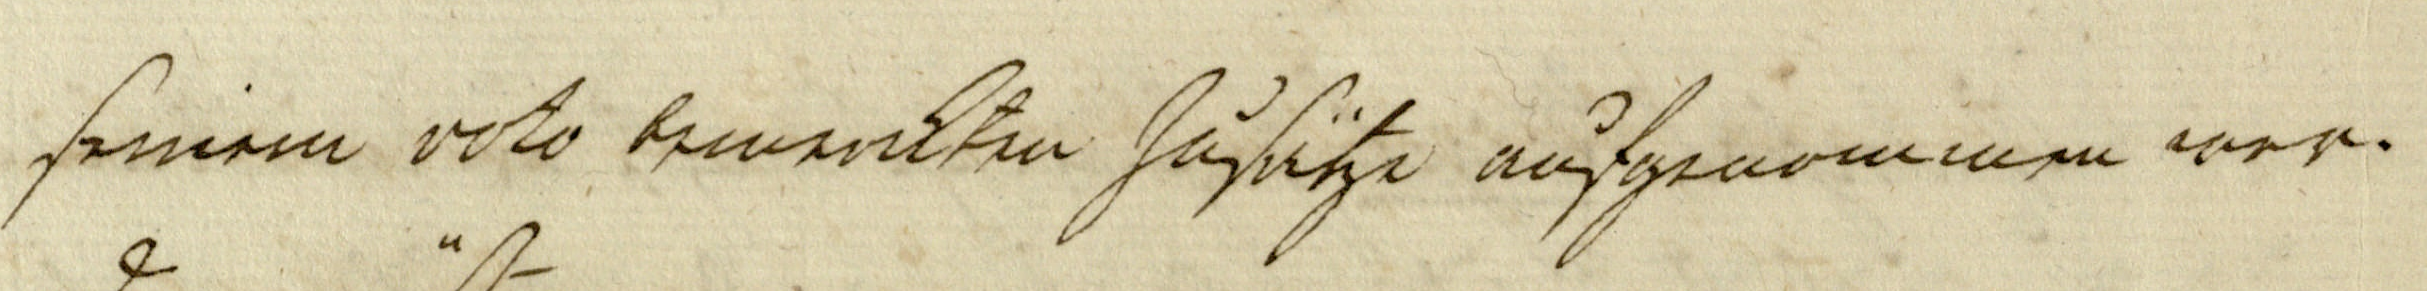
seinem voto bemerckten Zusätze aufgenommen wer¬
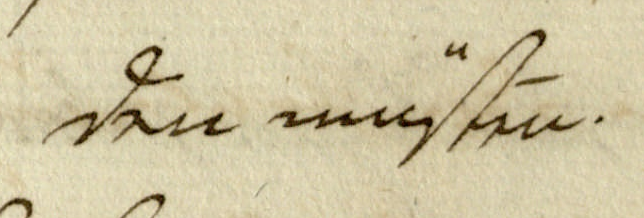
den müßten.
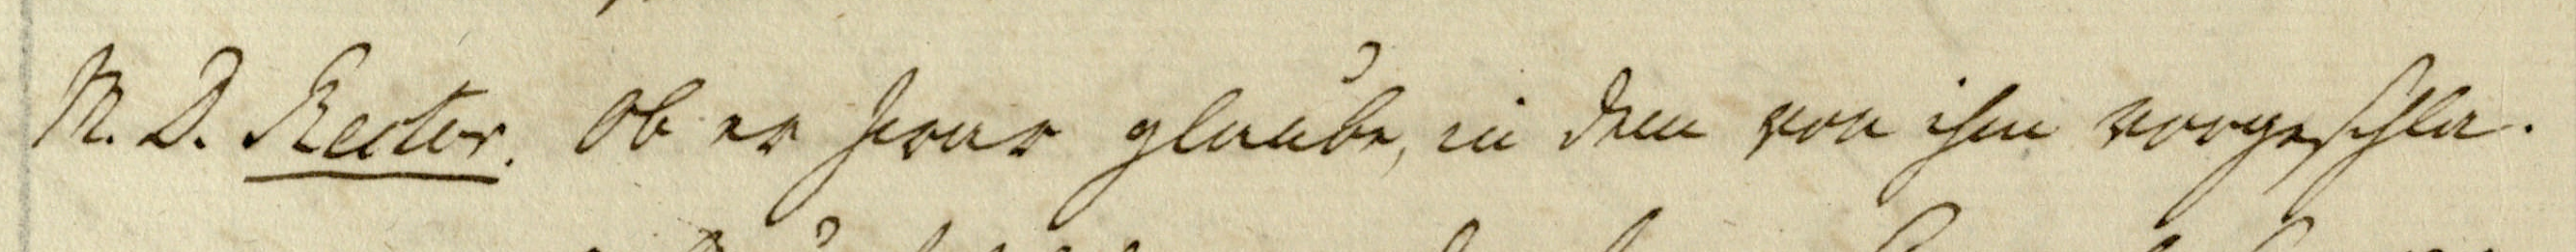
M. D. Rector. Ob er zwar glaube, in dem von ihm vorgeschla-
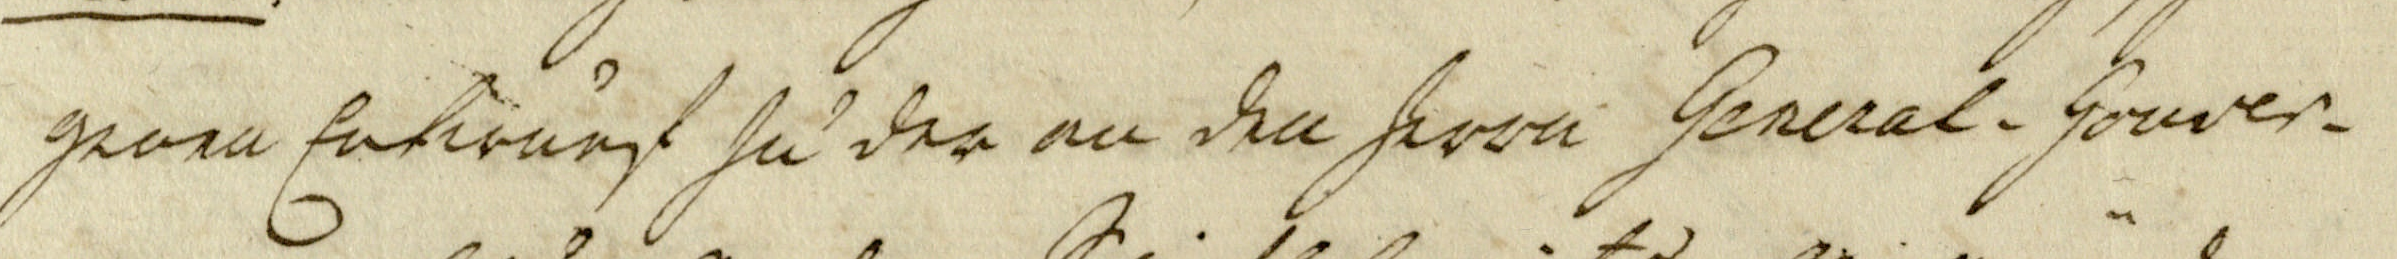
genen Entwurf zu der an den Herrn General- Gouver¬
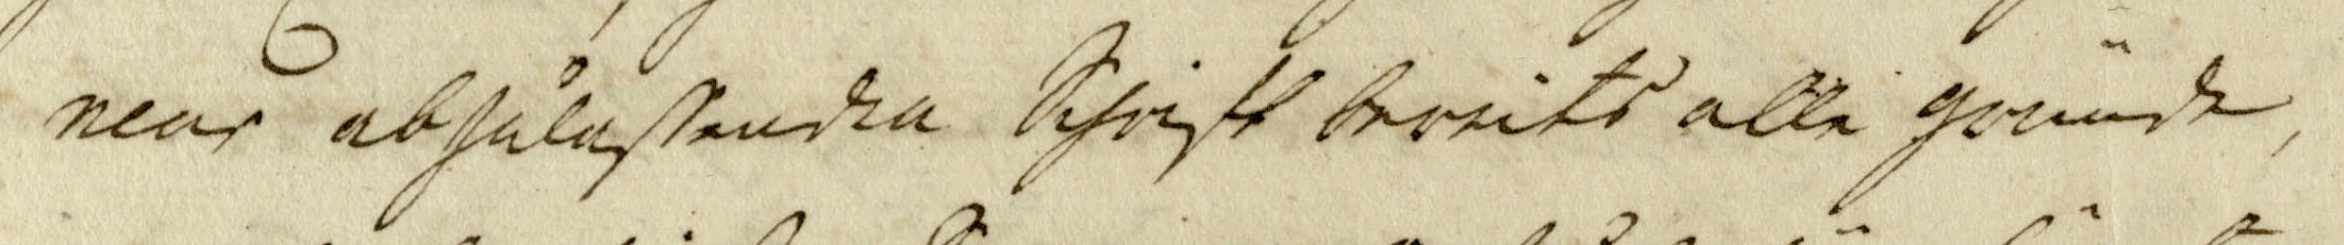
neur abzulassenden Schrift bereits alle Gründe,
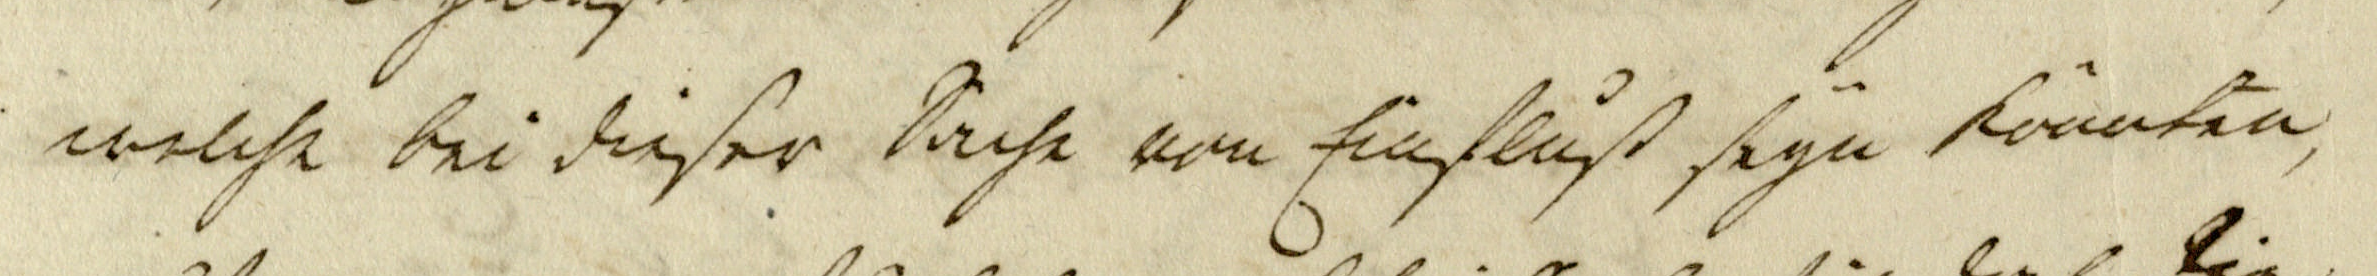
welche bei dieser Sache von Einfluß seÿn könnten,
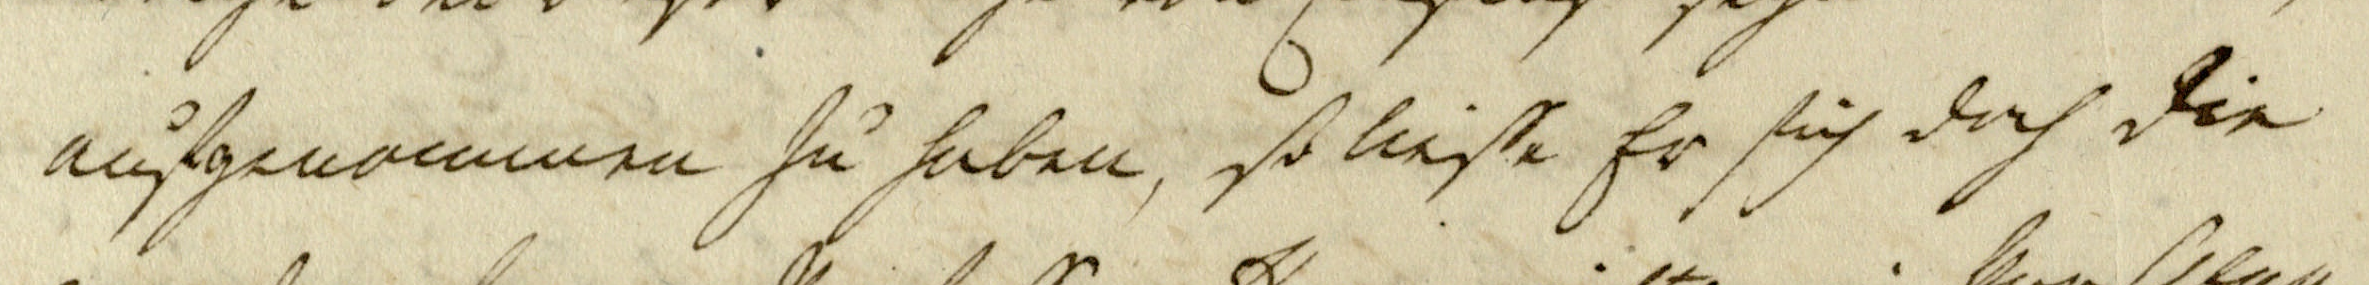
aufgenommen zu haben, so liesse Er sich doch die
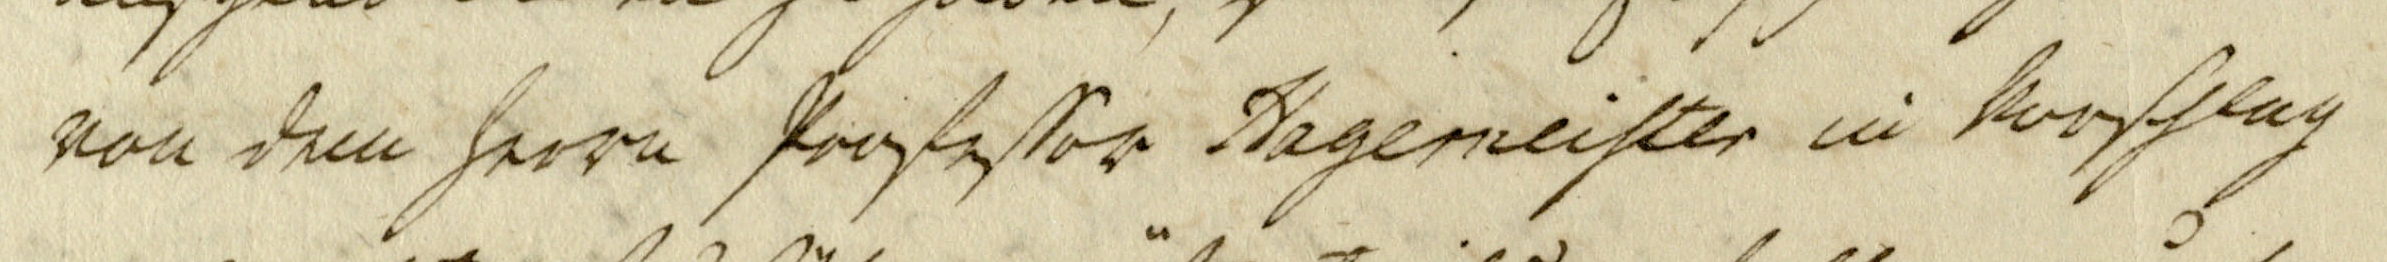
von dem Herrn Professor Hagemeister in Vorschlag
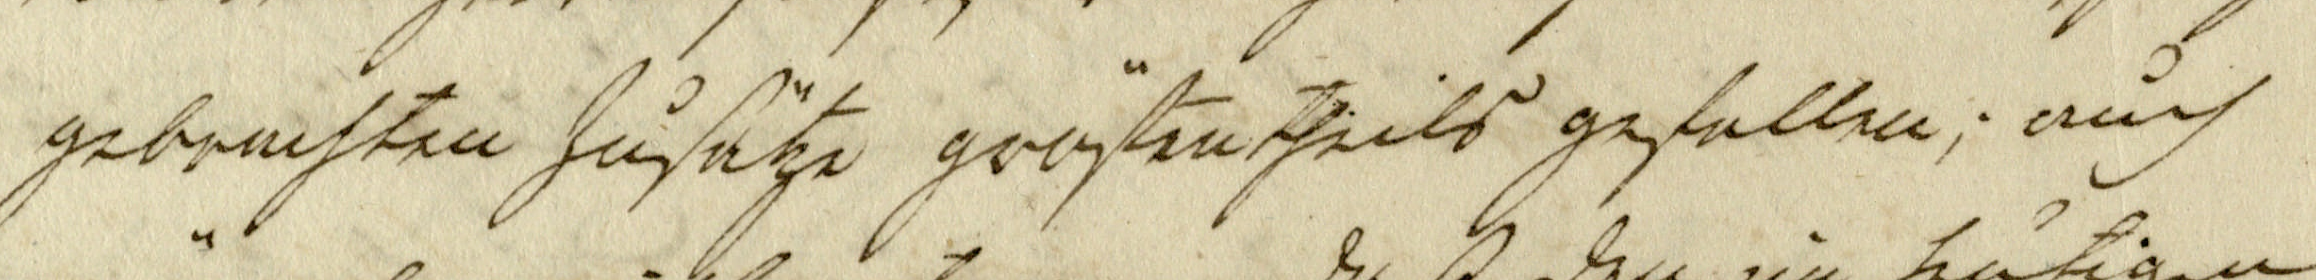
gebrachten Zusätze gröstentheils gefallen; auch
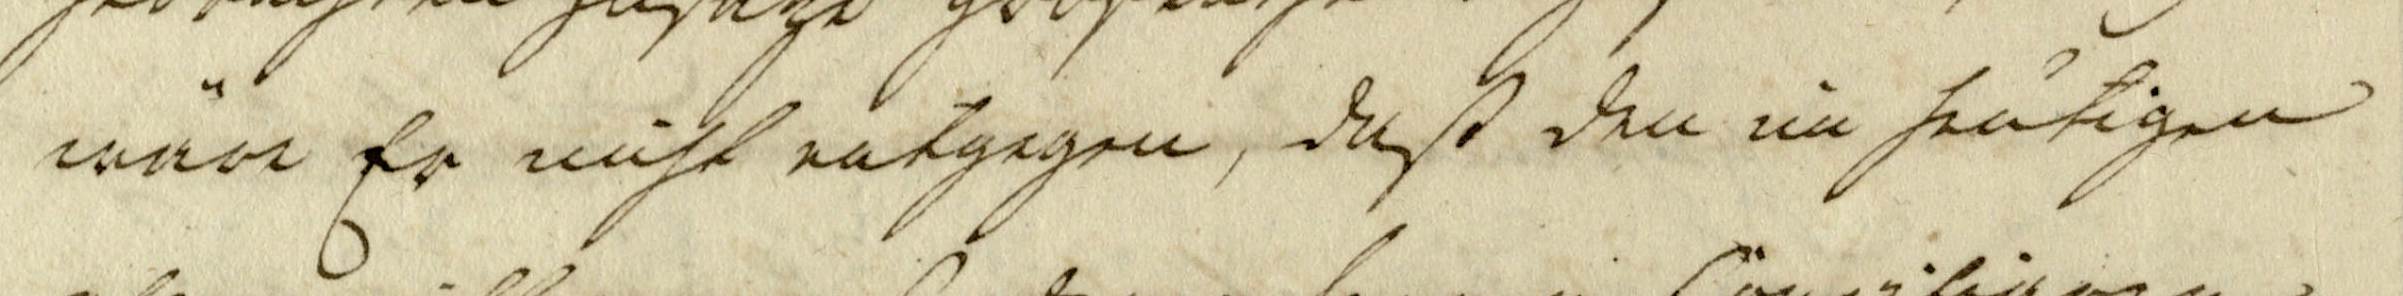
wäre Er nicht entgegen, daß den im heutigen
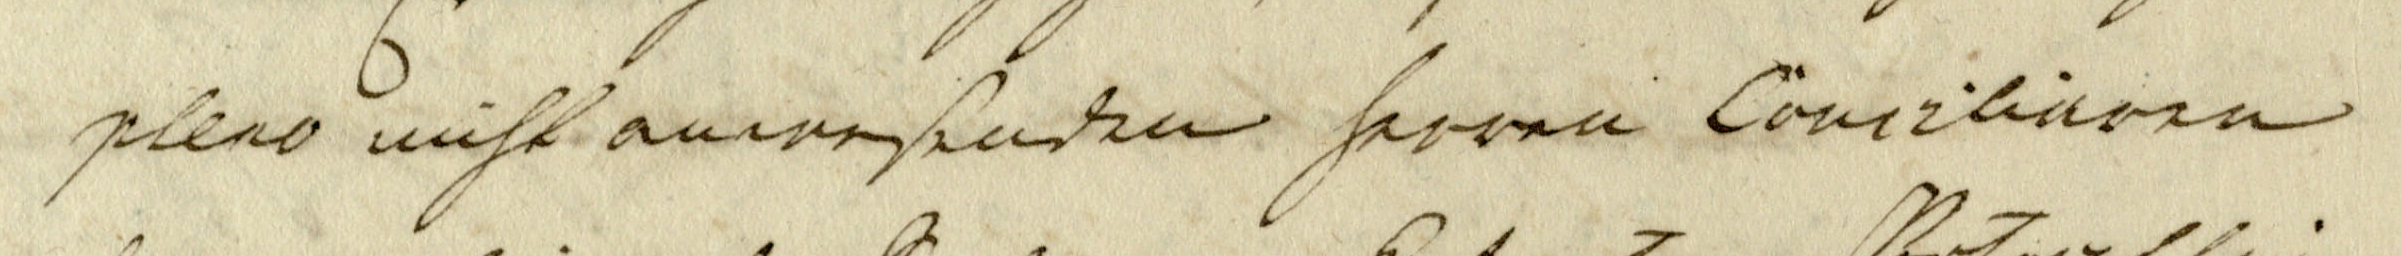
pleno nicht anwesenden Herren Conciliaren
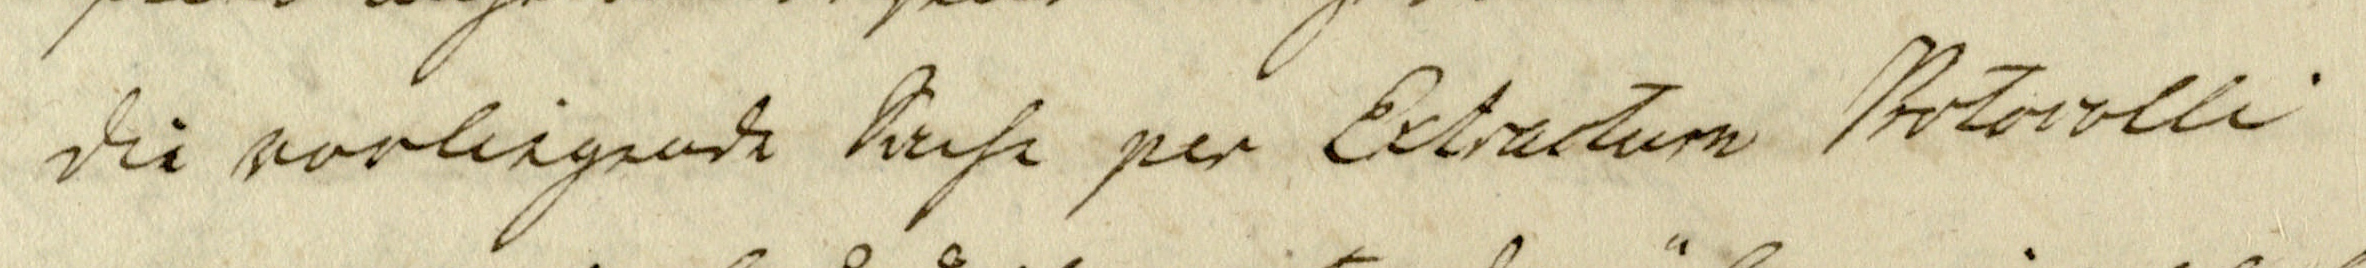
die vorliegende Sache per Extractum Protocolli
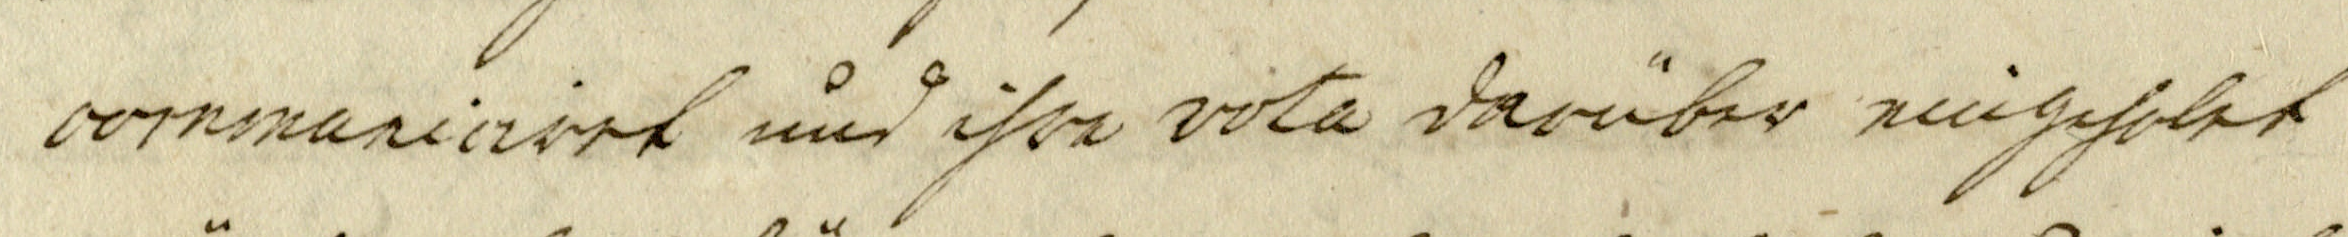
communiciret und ihre vota darüber eingeholet
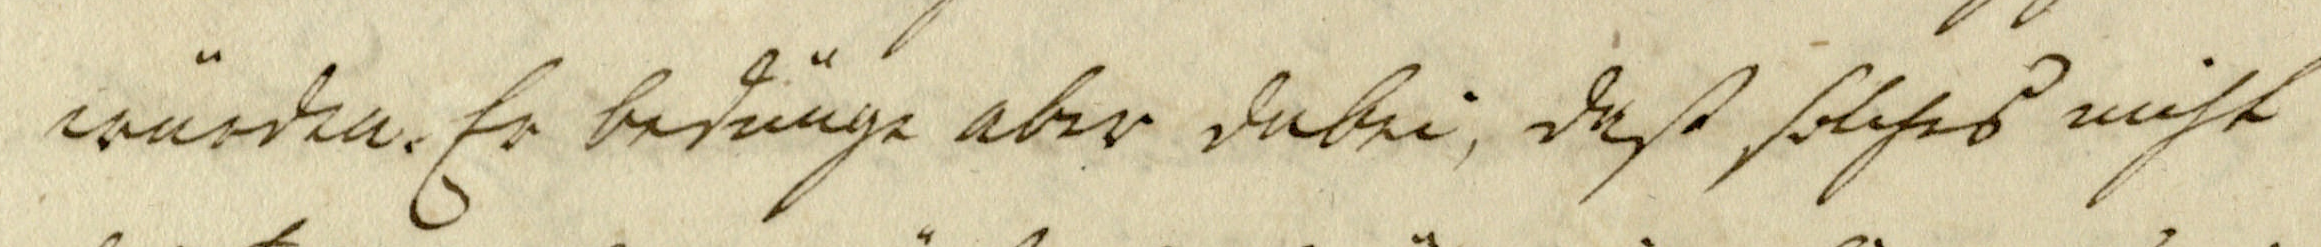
würden. Er bedünge aber dabei, daß solches nicht
